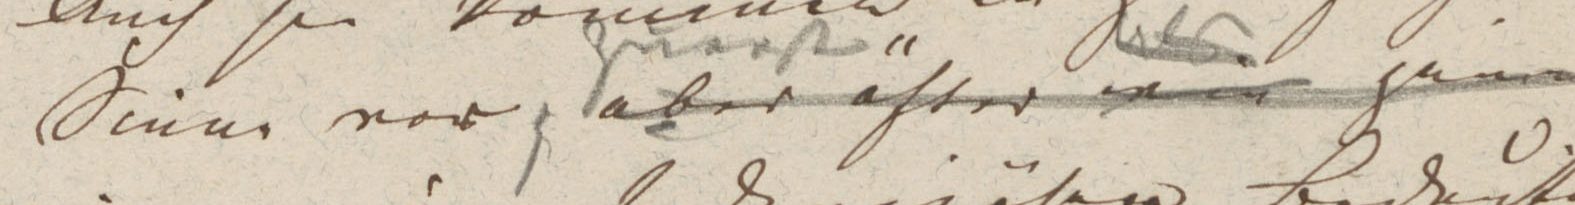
Sinne vor, zuerst aber öfter wie als jene
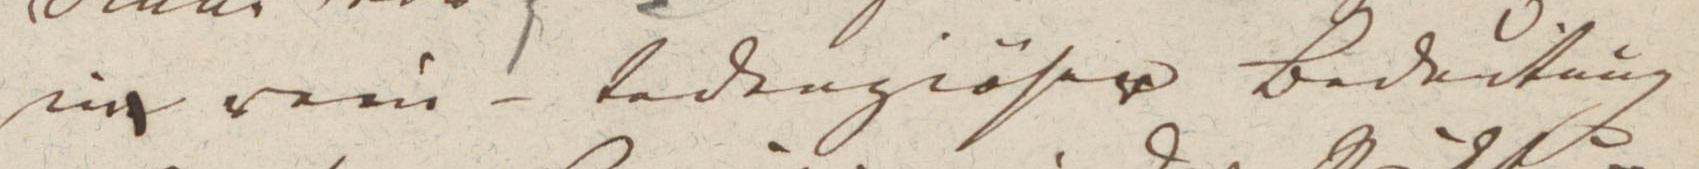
imn rein-tendenziösenr Bedeutung
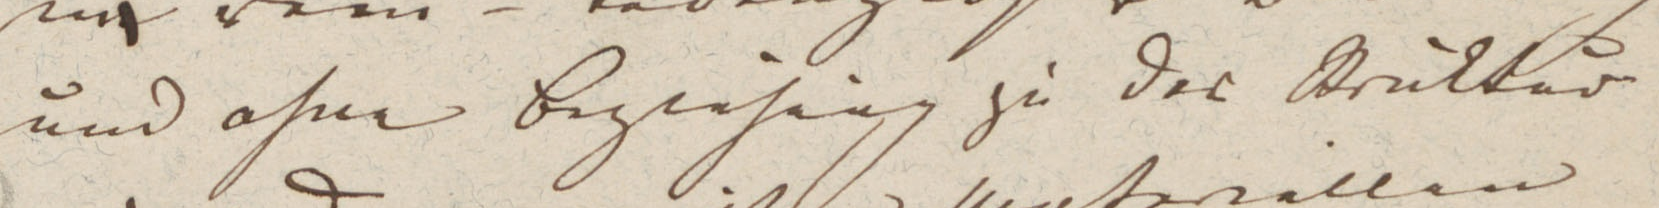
und ohne Beziehung zu der Struktur
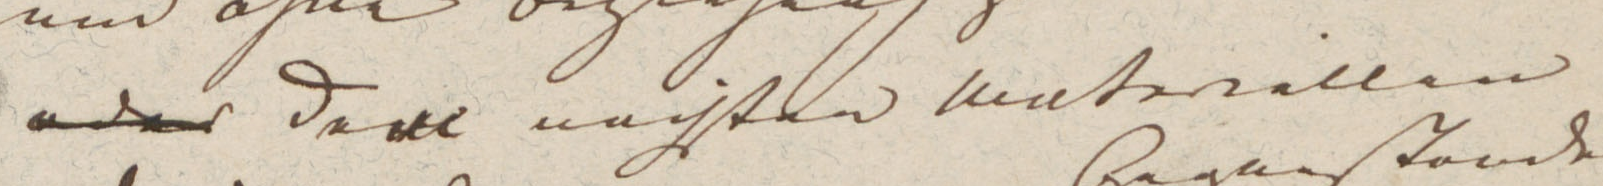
oder denm nächsten materiellen
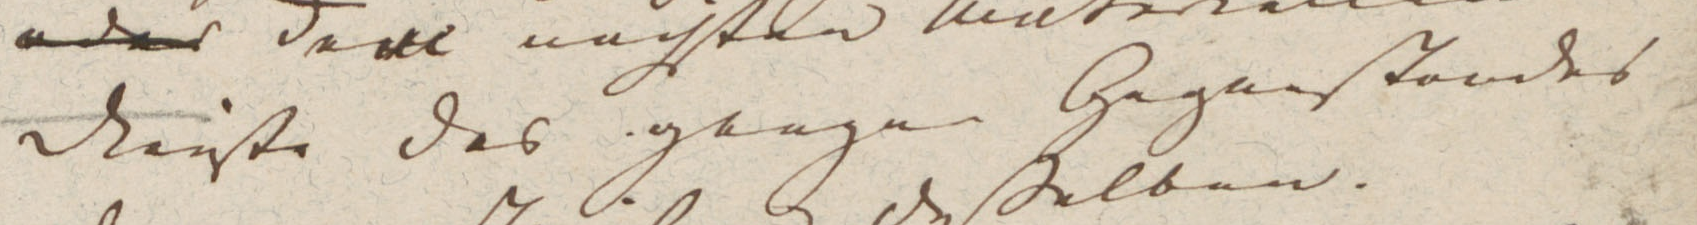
Dienste des ganzen Gegenstandes
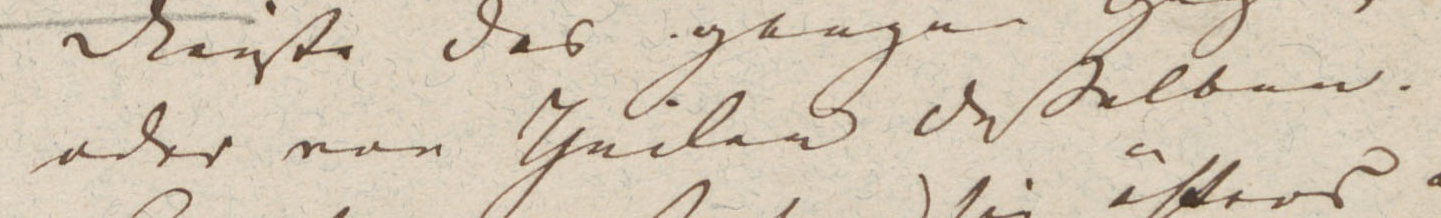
oder von Theilen desselben.
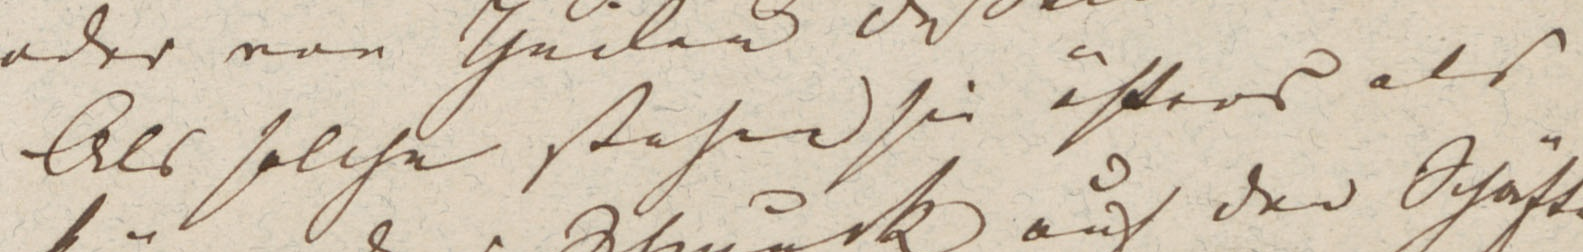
Als solche stehen sie öfters als
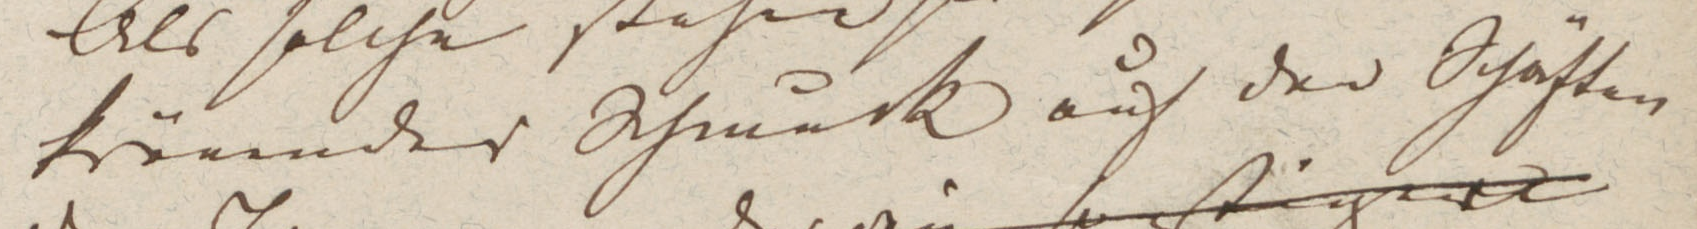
krönender Schmuck auf den Schäften
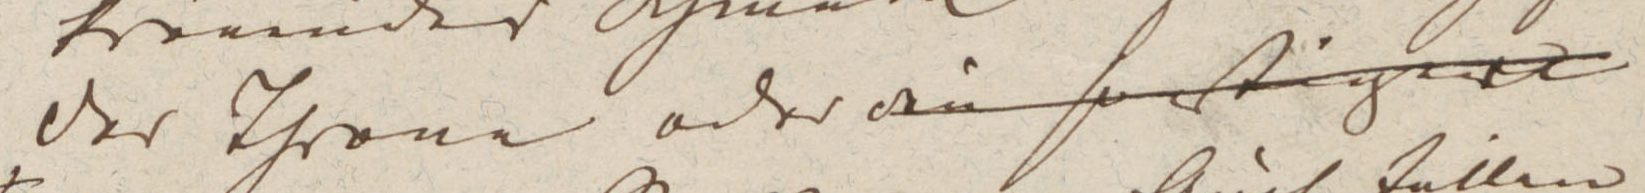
der Throne oder an sonstigenr
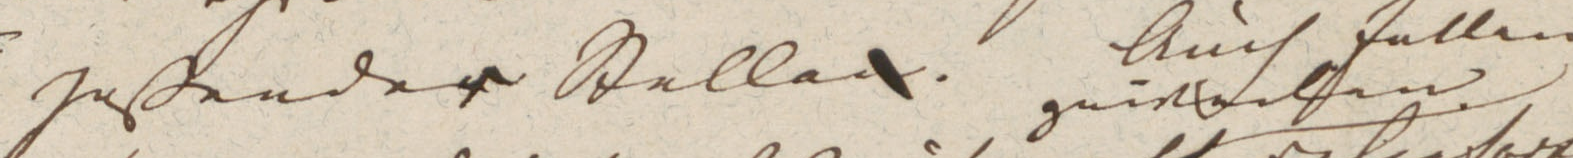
passendenr Stellen. Auch füllen
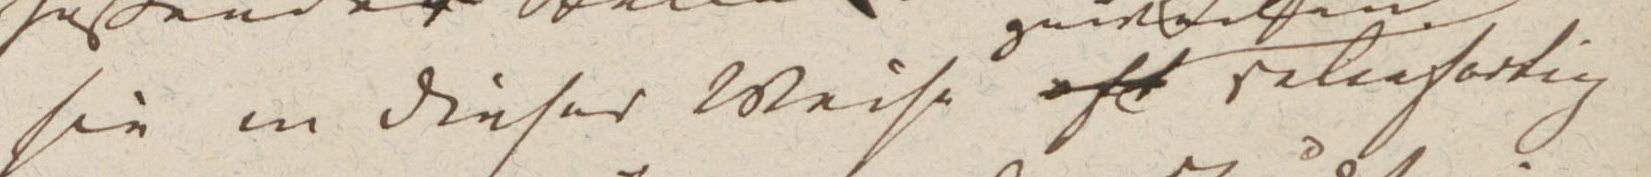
sie in dieser Weise oft zuweilen reliefartig
